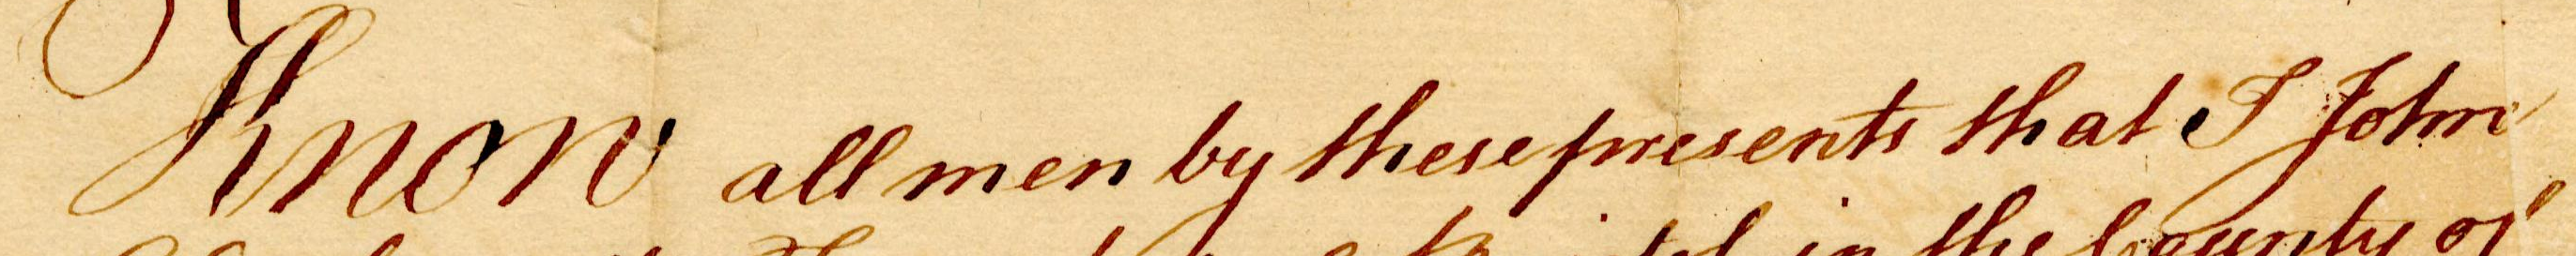Know all men by these presents that I John
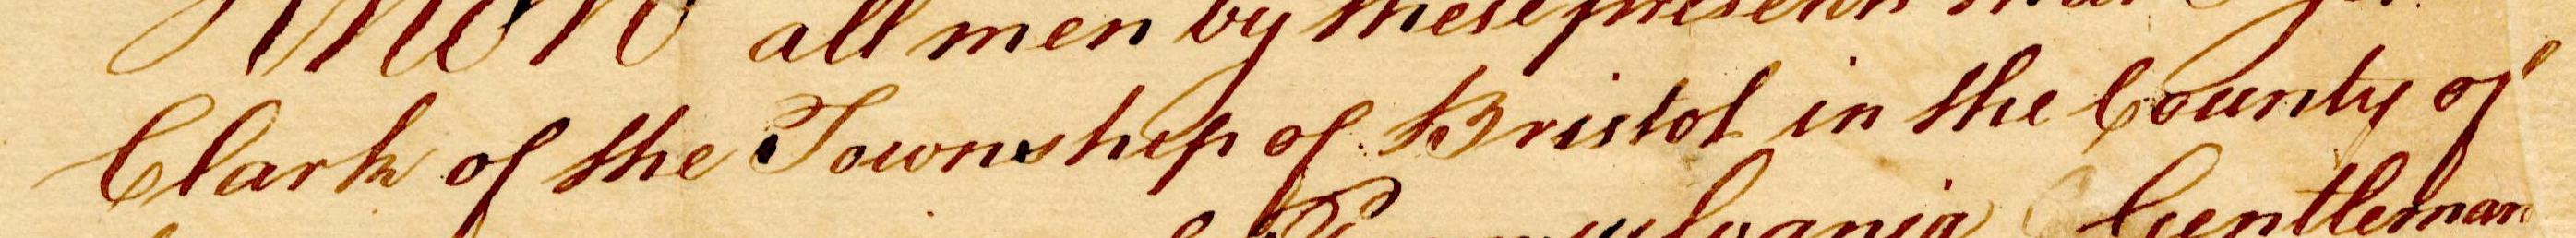Clark of the Township of Bristol in the County of
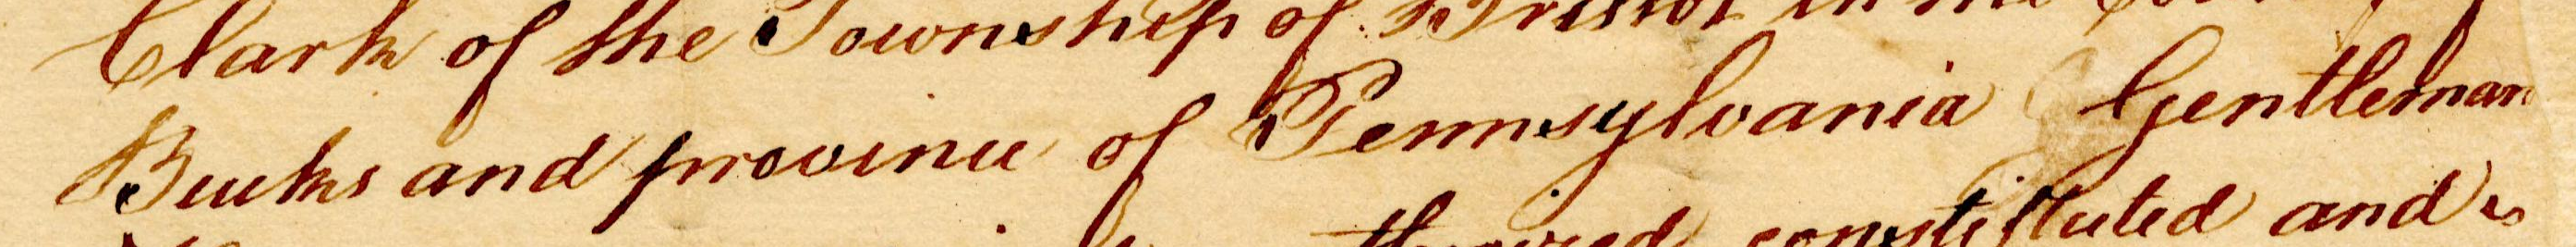Bucks and province of Pennsylvania Gentleman
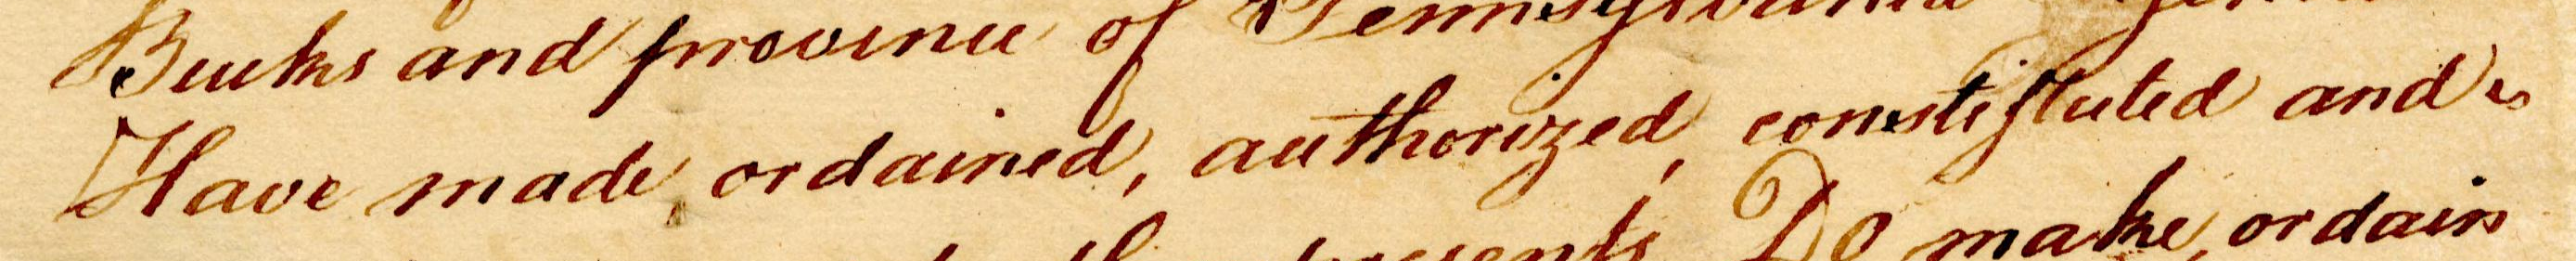Have mode ordained, authorized constituted and as
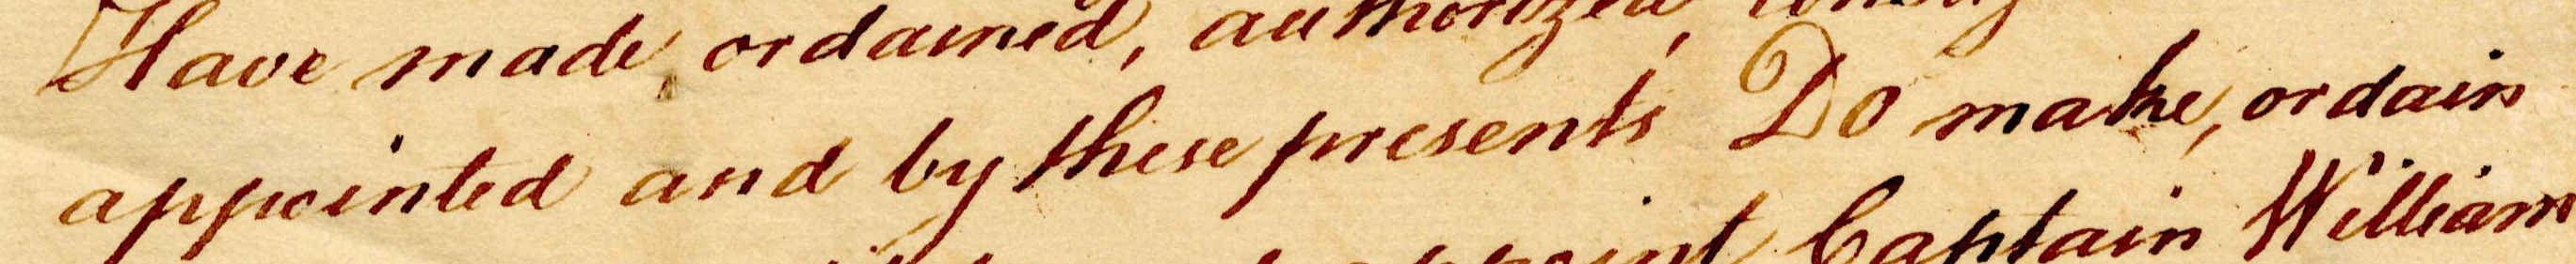appointed and by there presents Do make, ordain
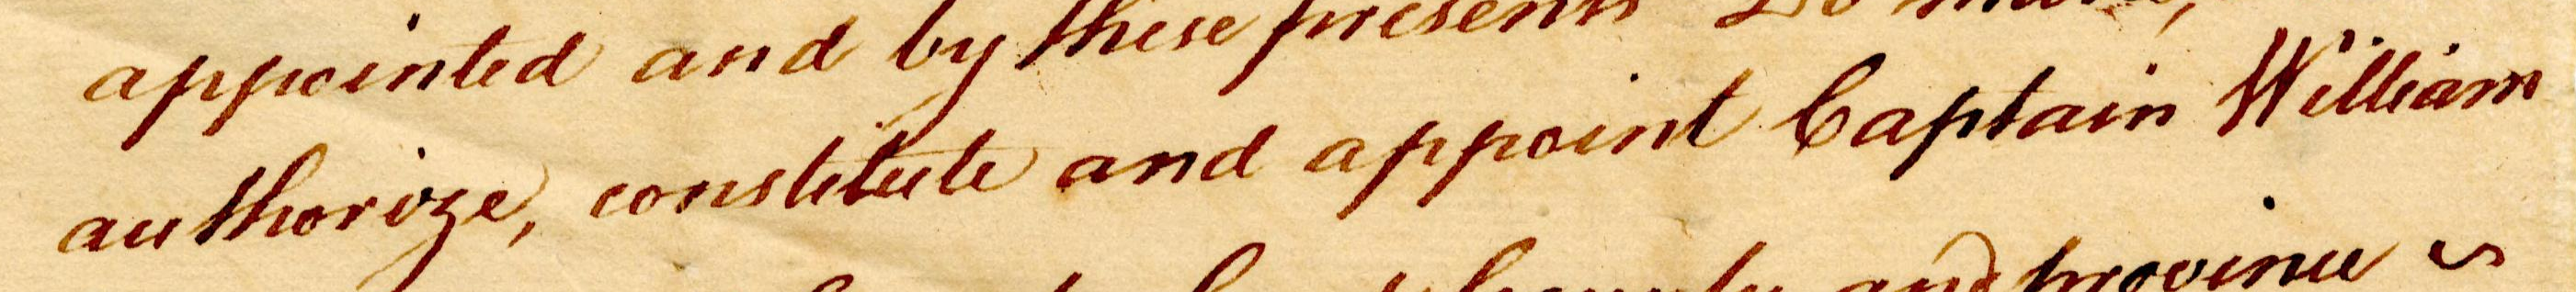authorize, constitute and appoint Captain William
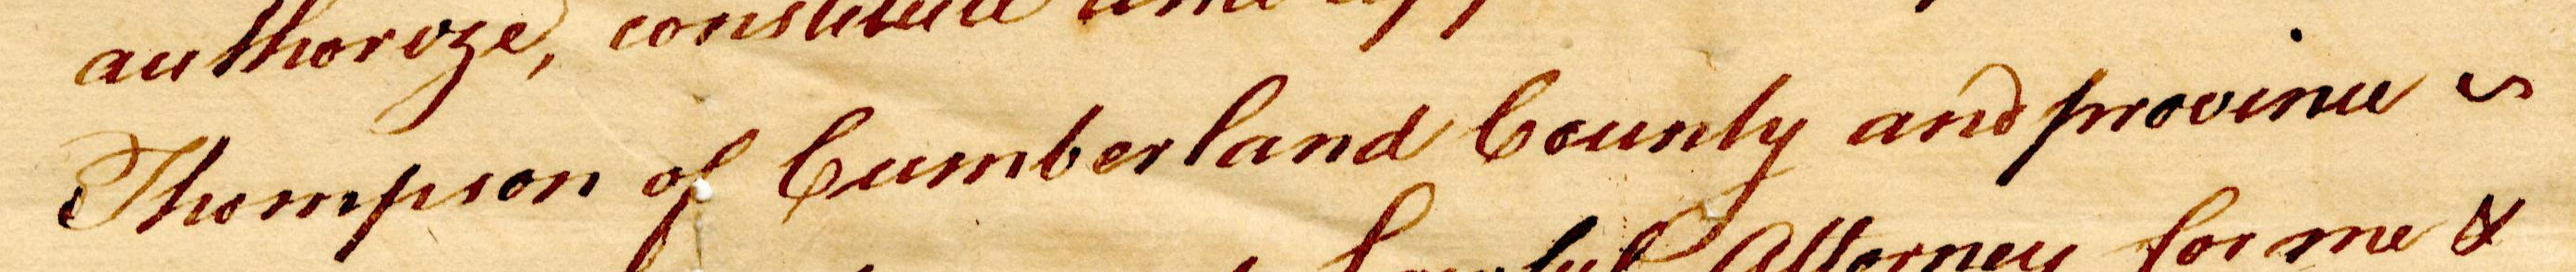Thompson of Cumberland County and province as
